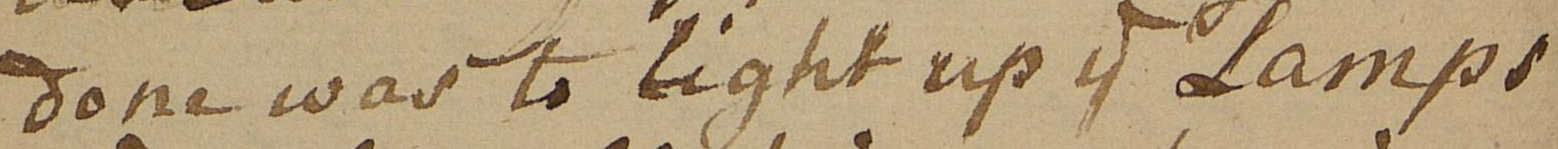done was to light up y^e Lamps
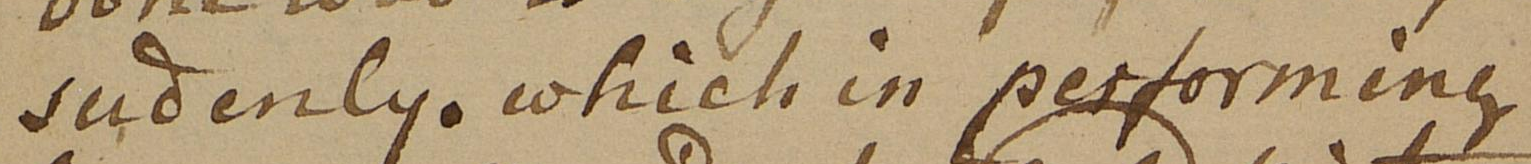sudenly. which in performing
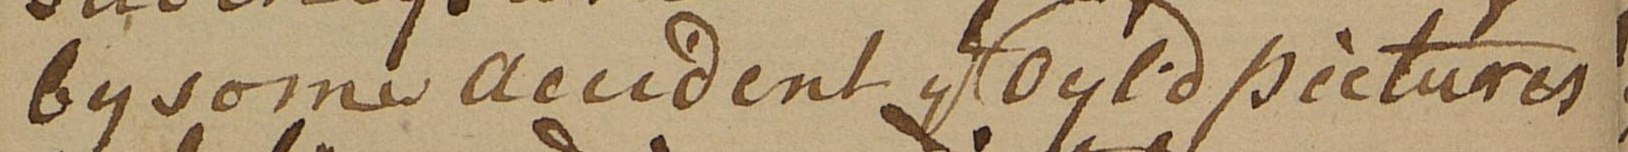by some accident y^e Oyl'd pictures
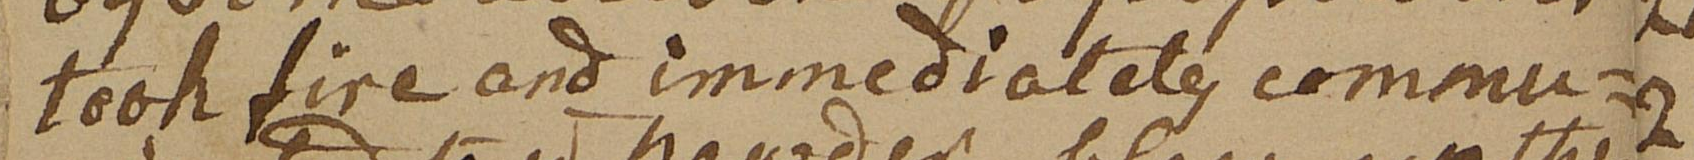took fire and immediately commu-
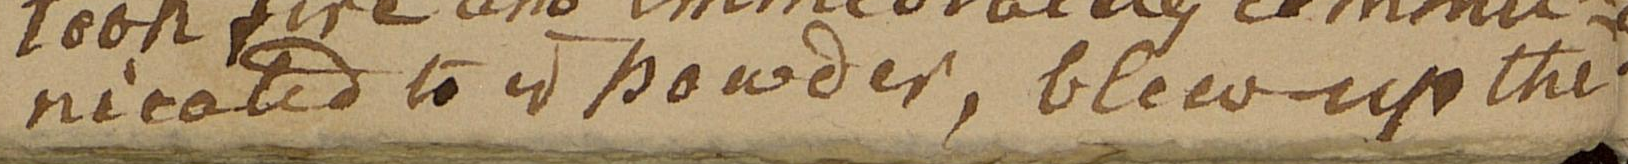nicated to y^e powder, blew up the
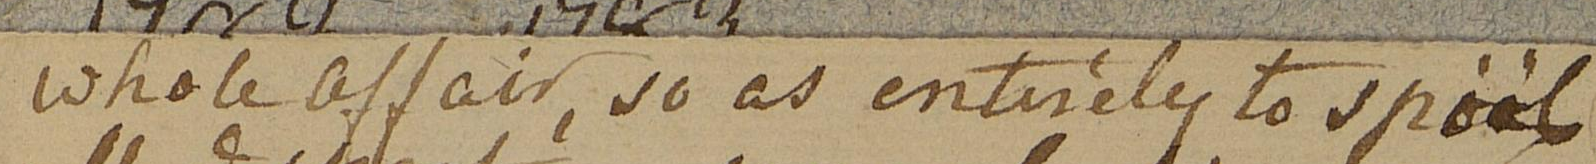whole affair, so as entirely to spoil
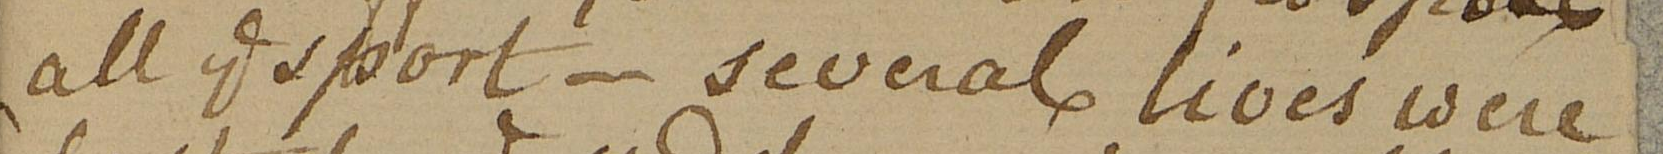all y^e sport- several lives were
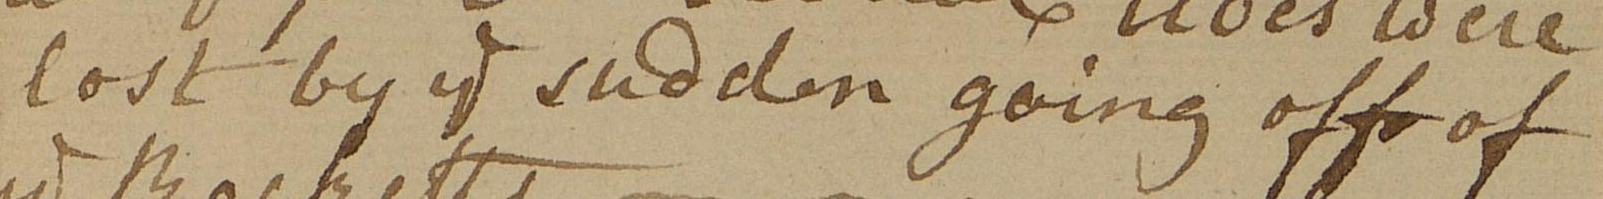lost by y^e sudden going off of
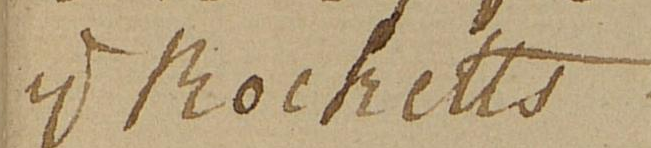y^e Rocketts
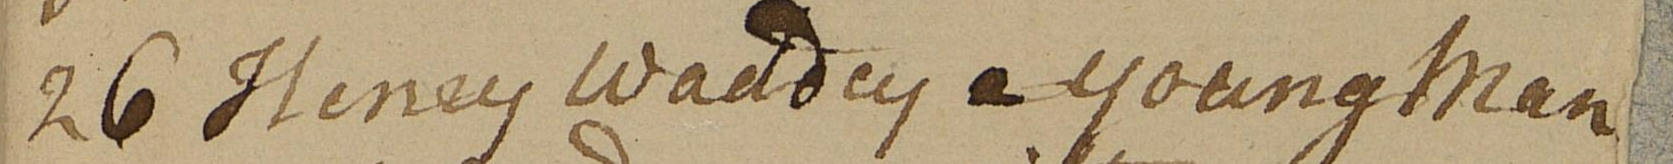26 Henry Waddey a young Man
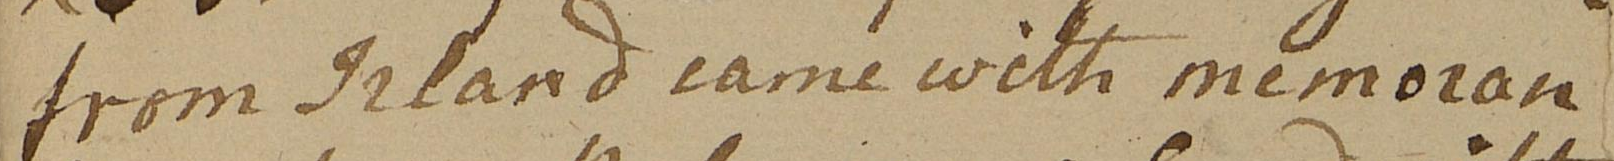from Irland came with memoran
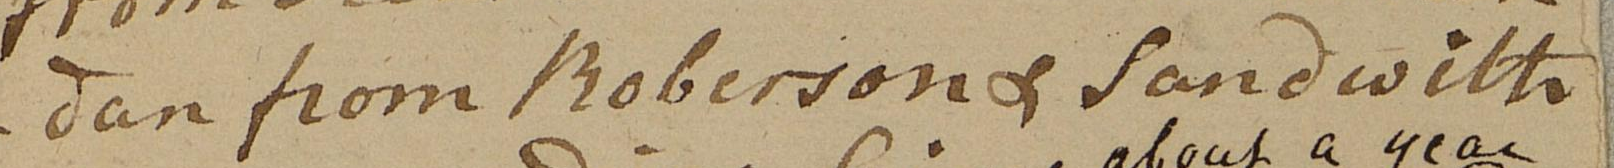-dan from Roberson & Sandwith
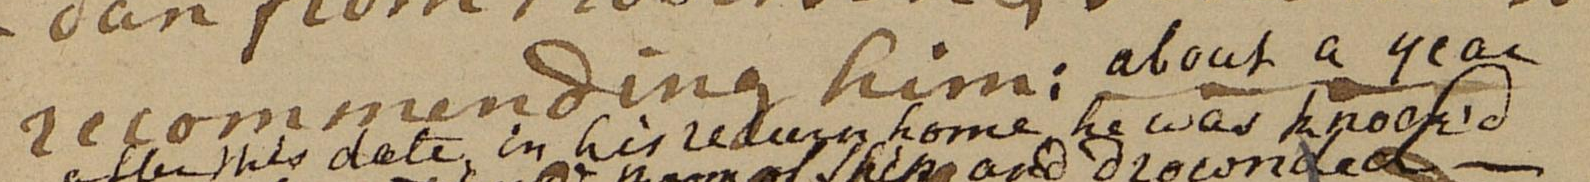recommending him: about a year
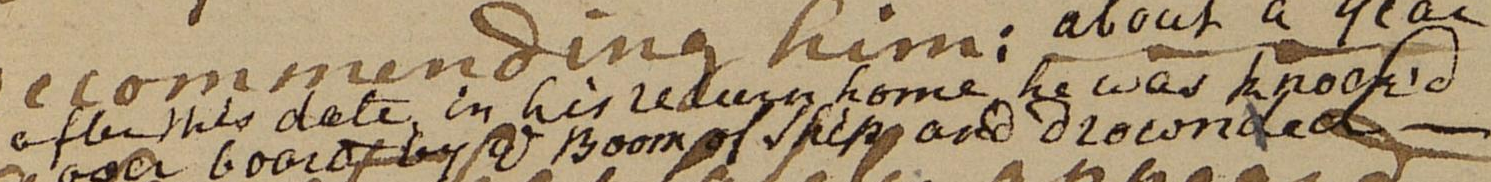after this date, in his return home he was knock'd
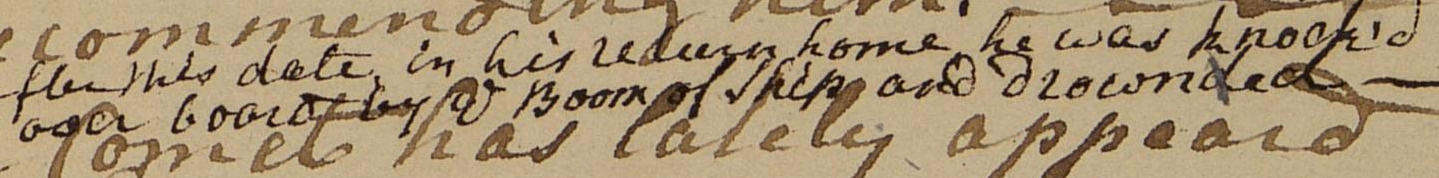over board by y^e Boom of Ship and drownded-
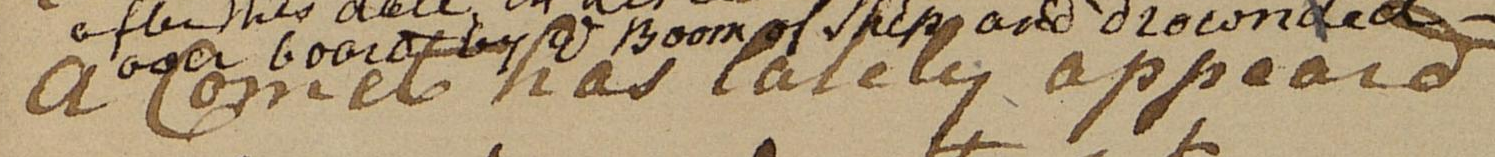A Comet has lately appeard
